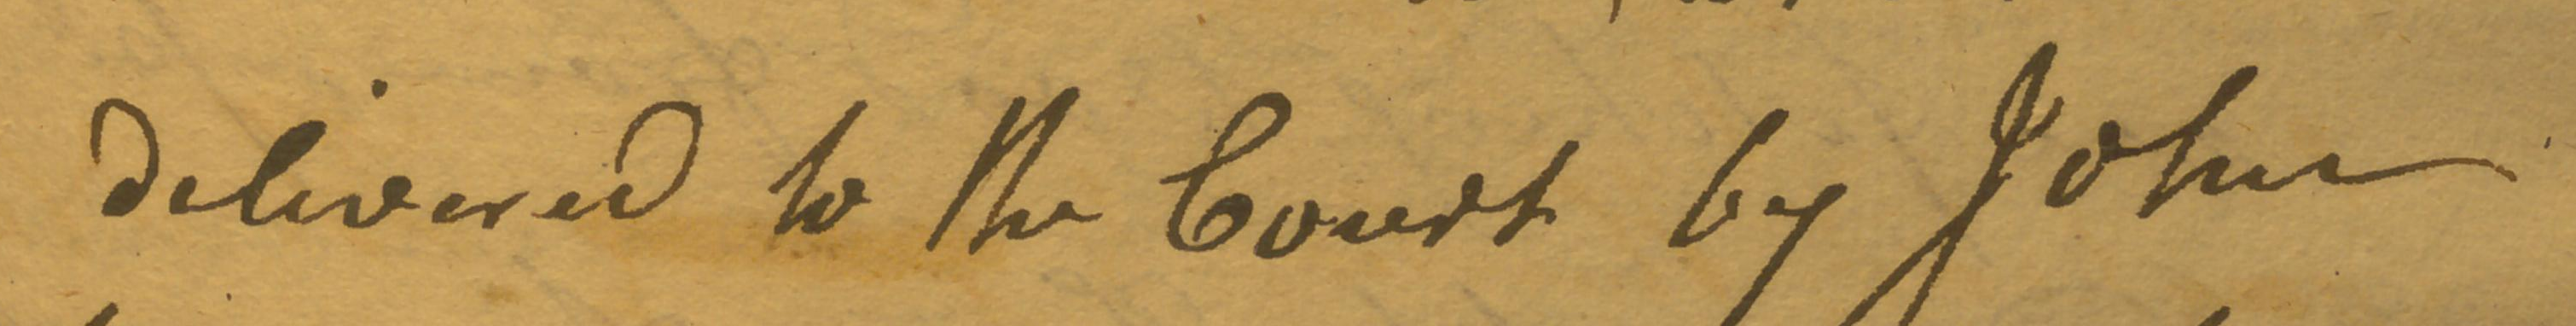delivered to the Court by John
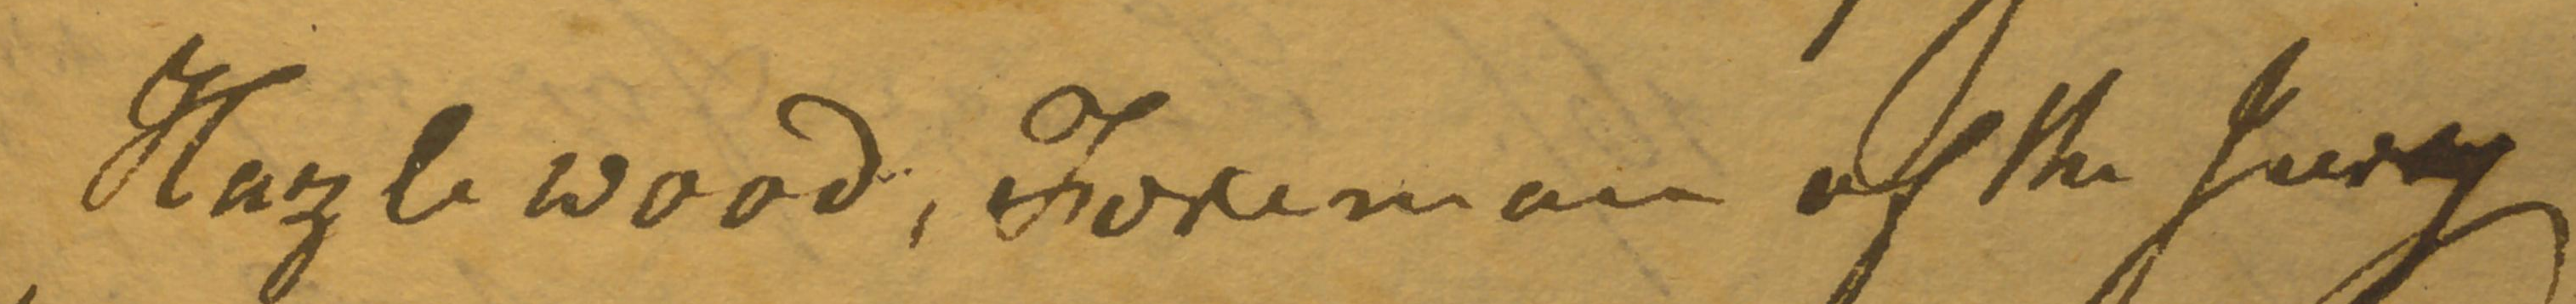Hazlewood, Foreman of the Jurry
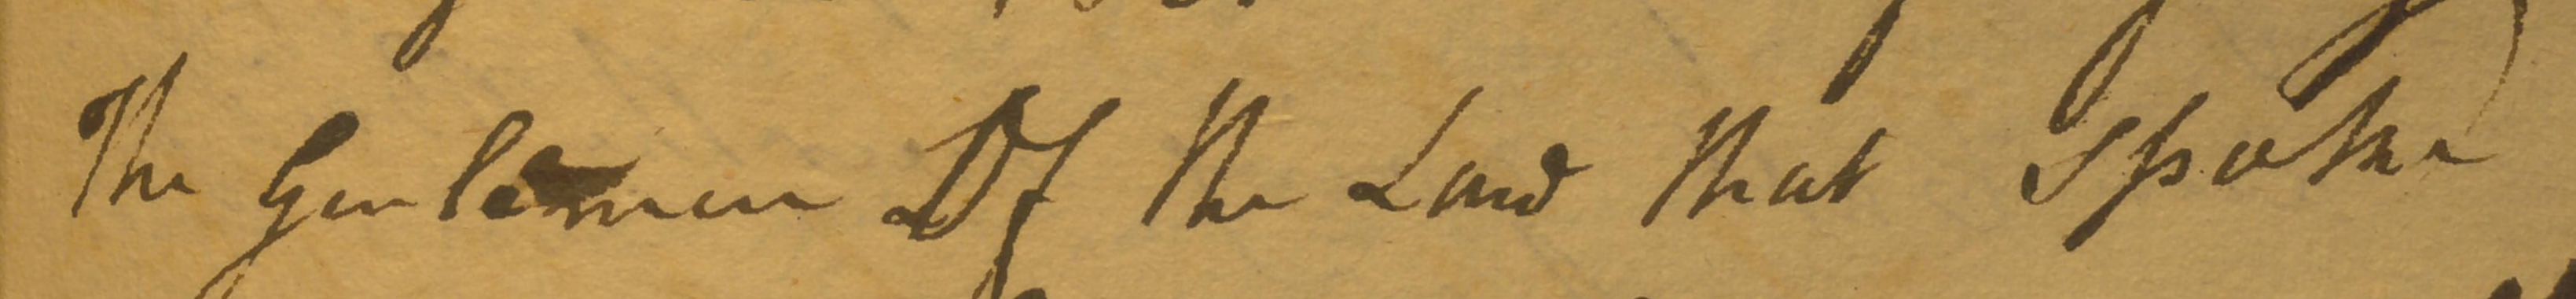The Genlemen Of the Law that spake
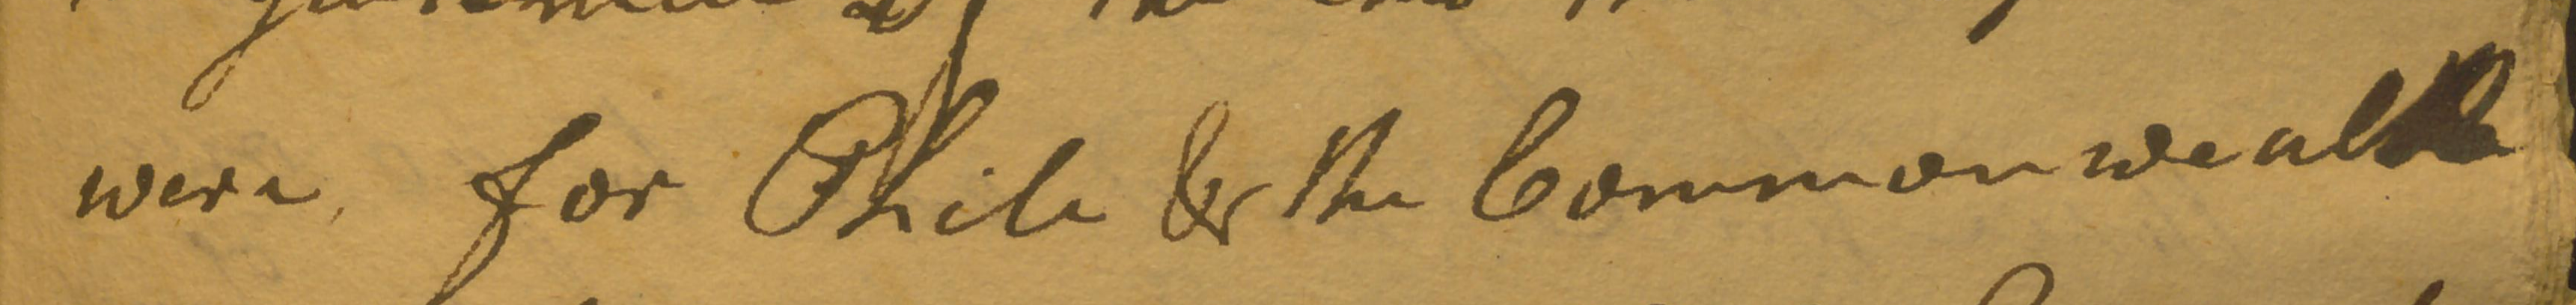were, for Phile & the Commonwealth
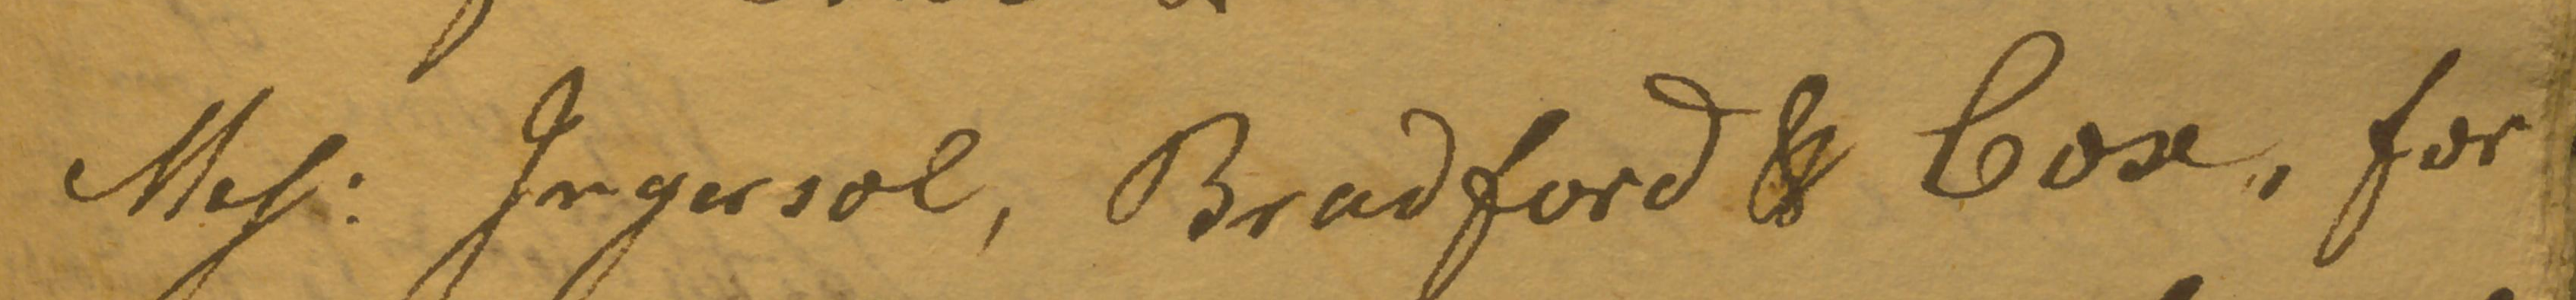Mes: Ingersol, Bradford & Cox, for
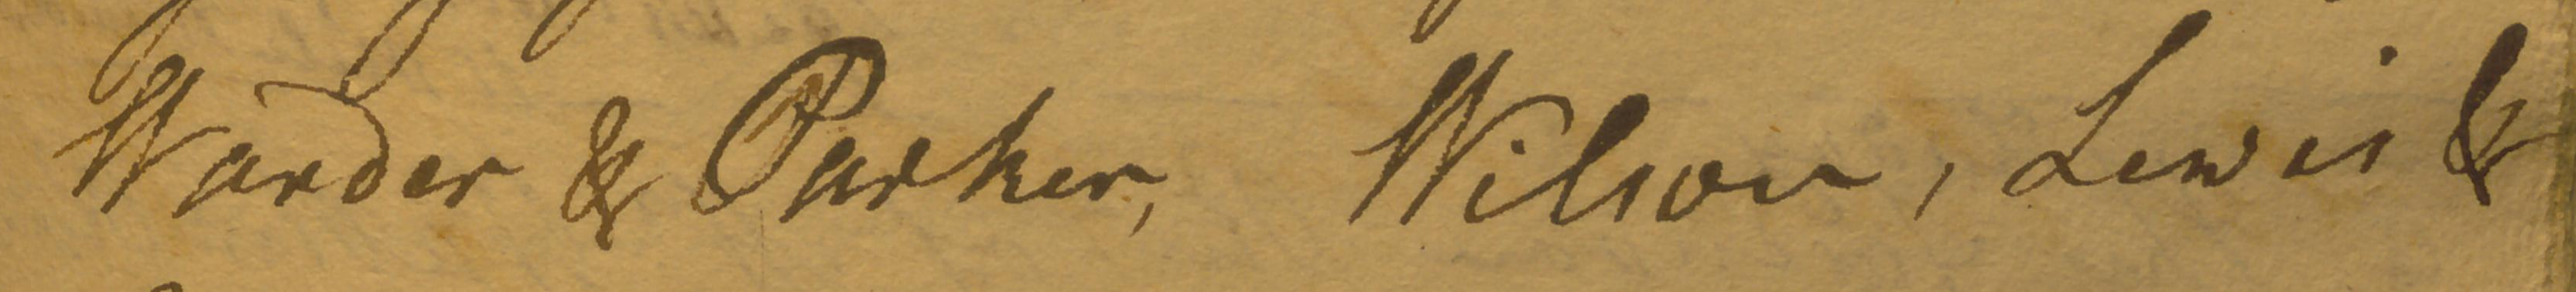Harder & Parker, Wilson, Lewis &
